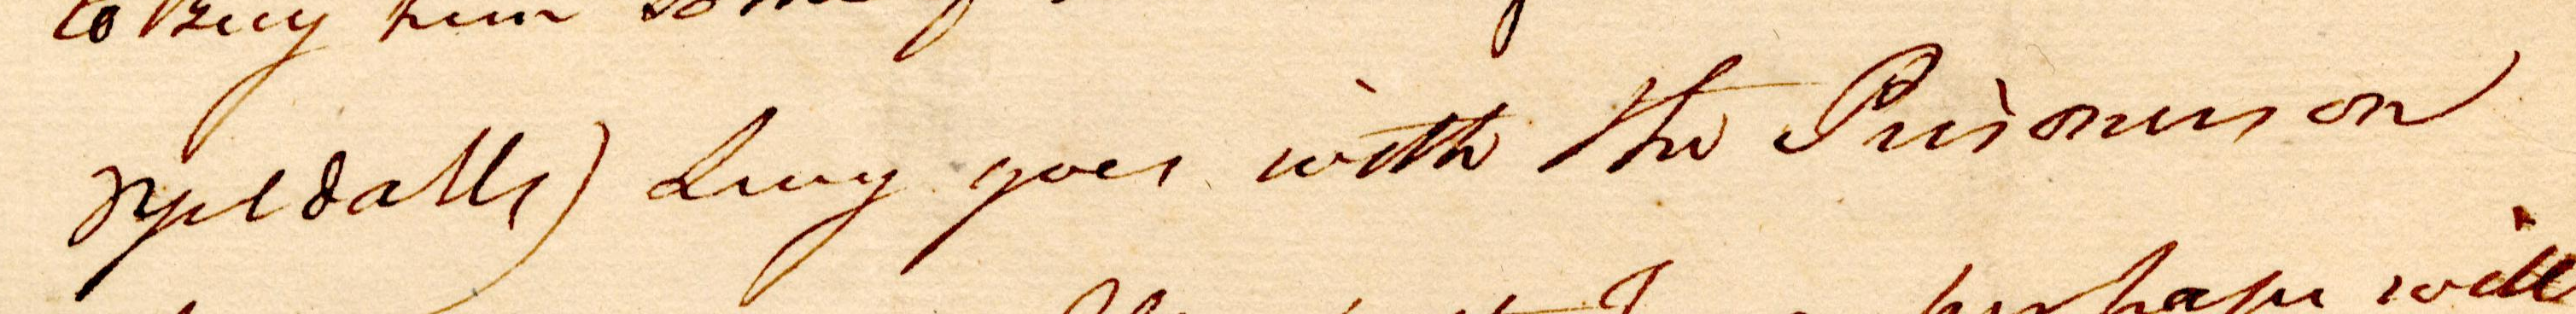yeldalls) Levy goes with the Prisoners on
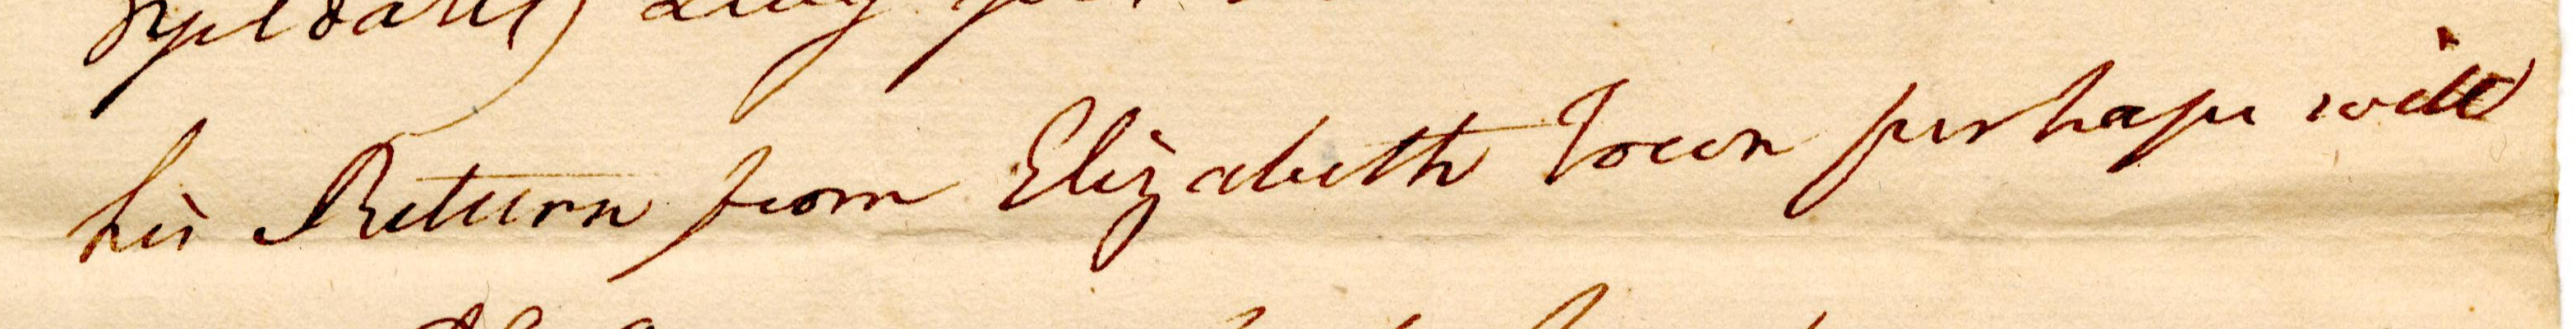his Return from Elizabeth Town perhaps will
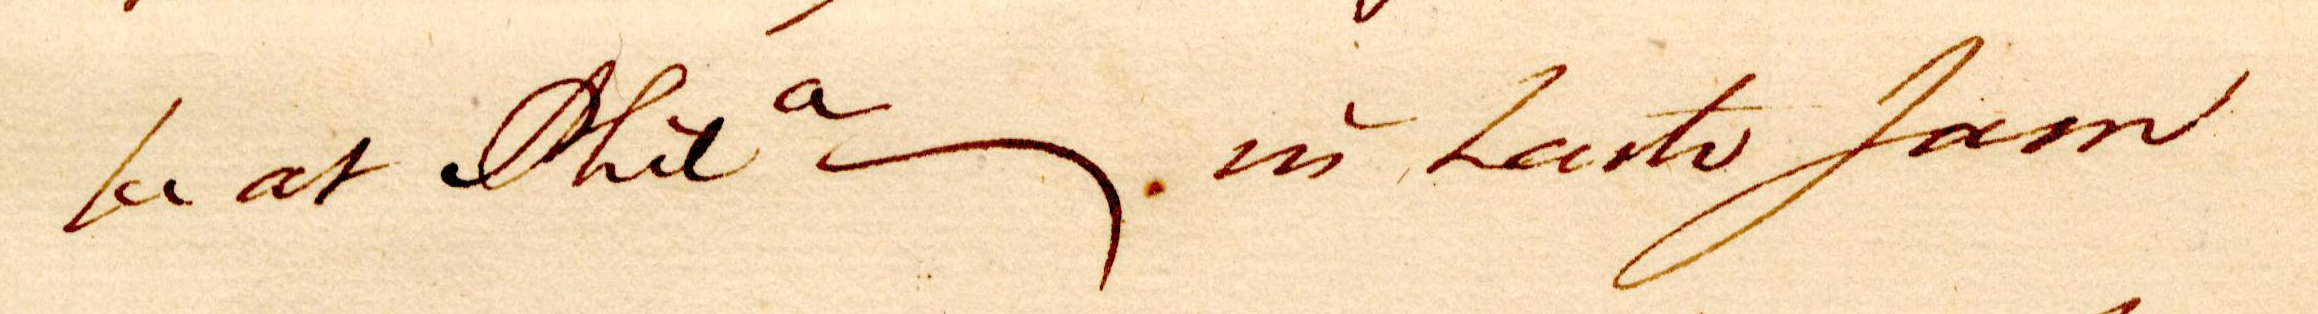be at Phil^a- in haste I am
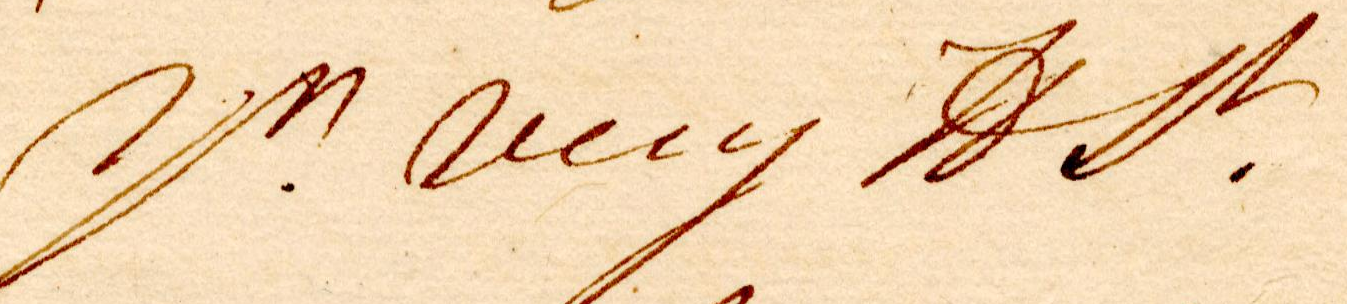Y^r. very H S^t.
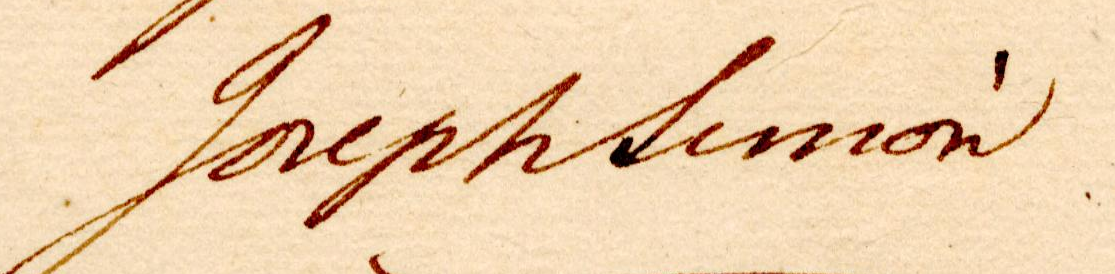Joseph Simon
